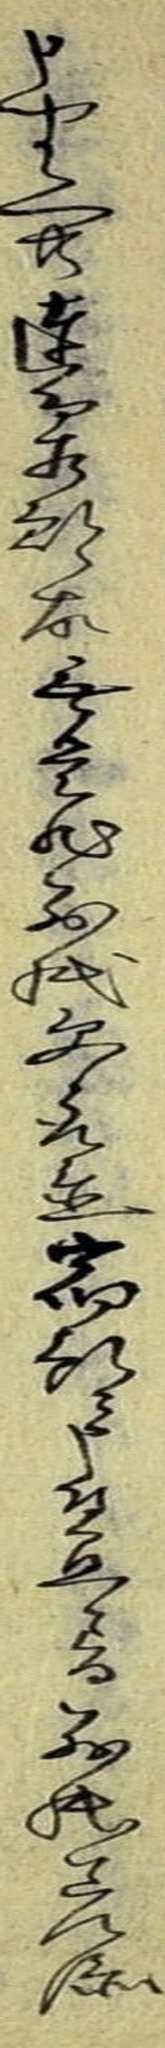申聞候へ共達而相願候故無是非別紙受取置宿預に申付置候旨別紙差添
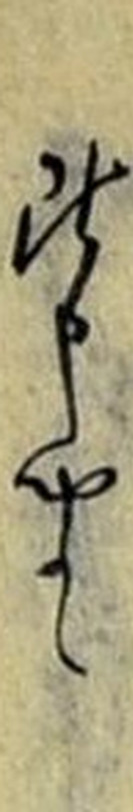断申聞候
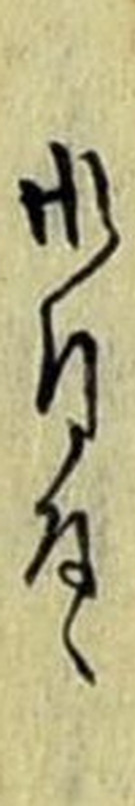御目付へ
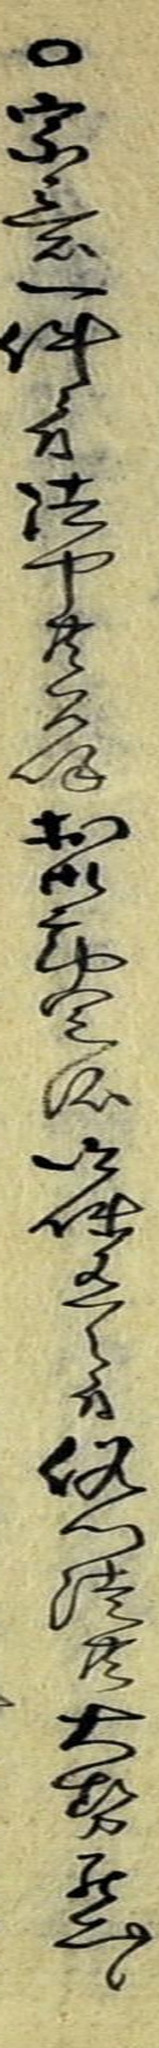○宗意一件に付法中共召呼於御勘定所吟味有之に付俗門徒共大勢罷出候
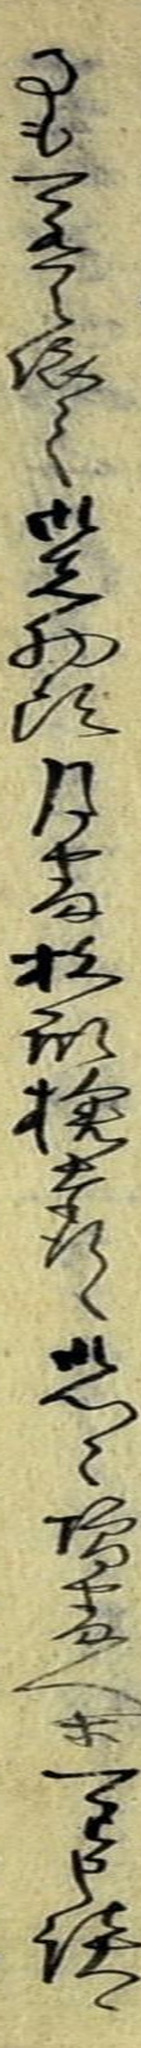事も可有之依之御先物頭月番杉形鎗奉行へ御門〳〵増番人等可被申談候
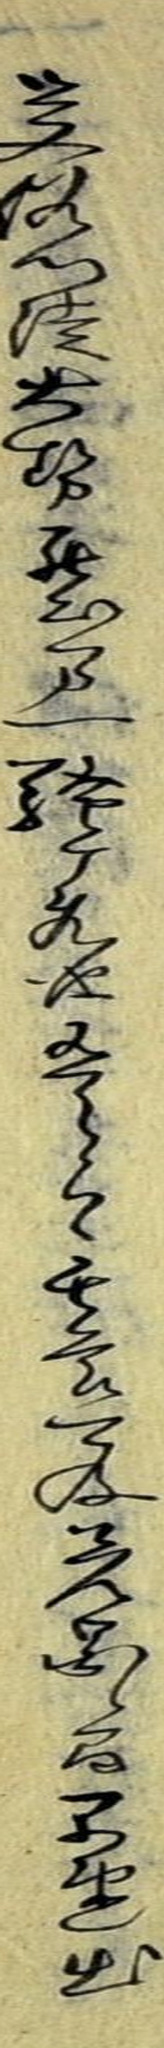且又俗門徒大勢罷出万一騒ケ敷儀有之候はヽ其節可及差図候間早速出
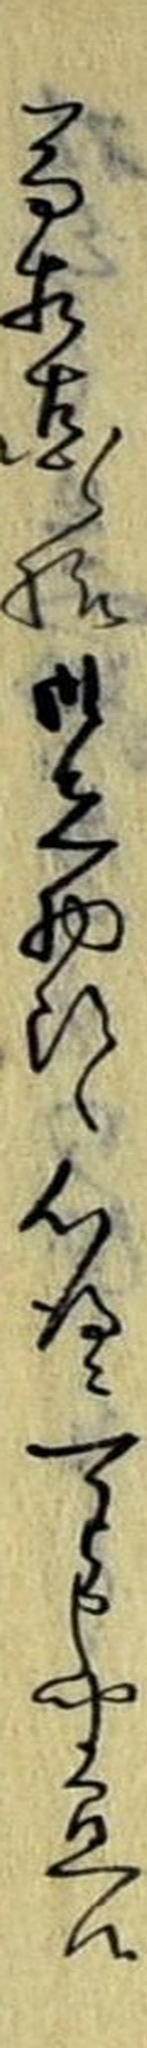馬相固候様御先物頭へ心得に可被申聞置候
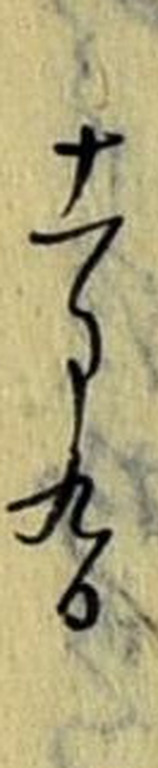十一月九日

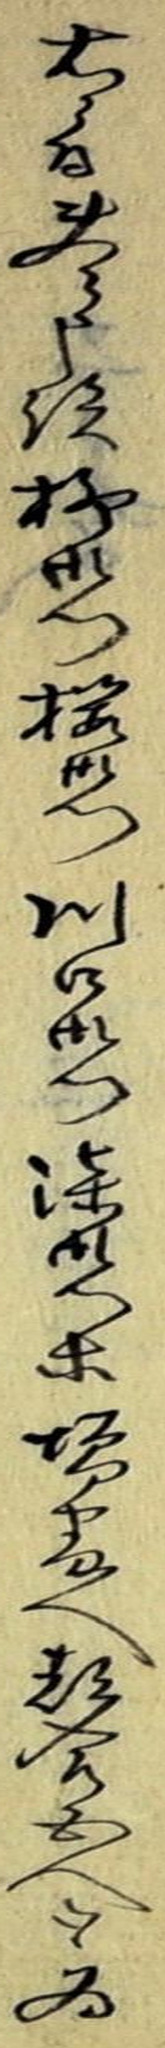右に付夫々申談柳御門桜御門川口御門漆御門等増番人都合五人つヽ為
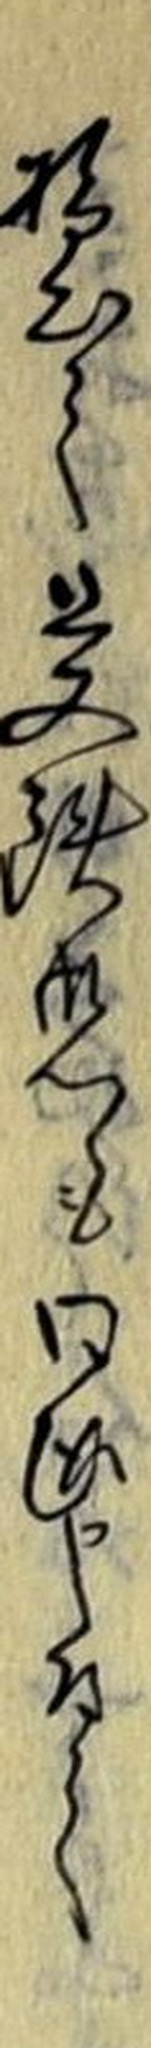指出之且又鉄御門も同趣申付之
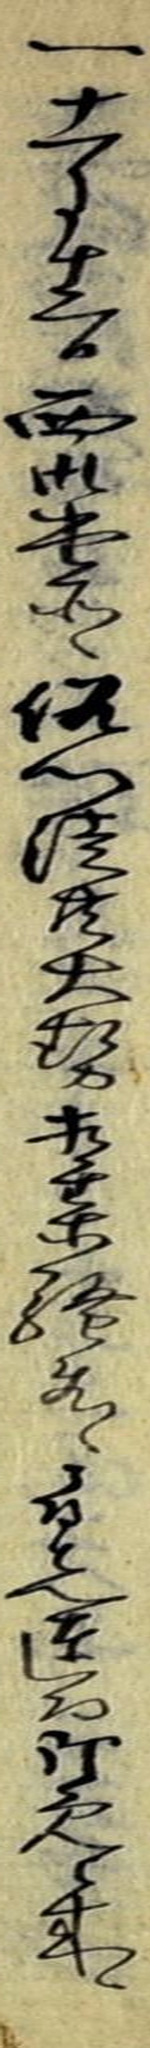一十一月十二日西御堂所へ俗門徒共大勢相集り騒敷候に付先達而御免来候
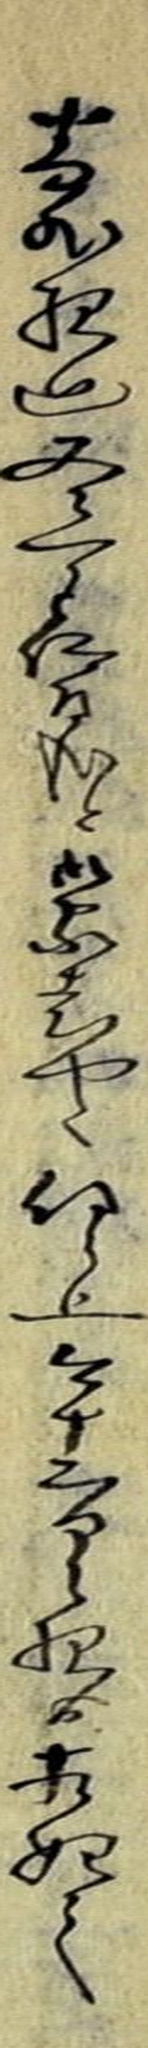番外夜廻又々被仰付哉と御家老中へ伺之上今十二日之夜ゟ相始之
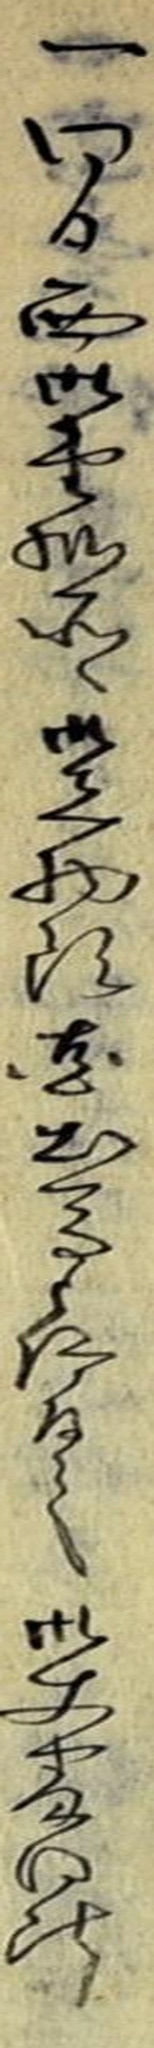一同日西御堂掛所へ御先物頭固出馬被仰付之御使番同断
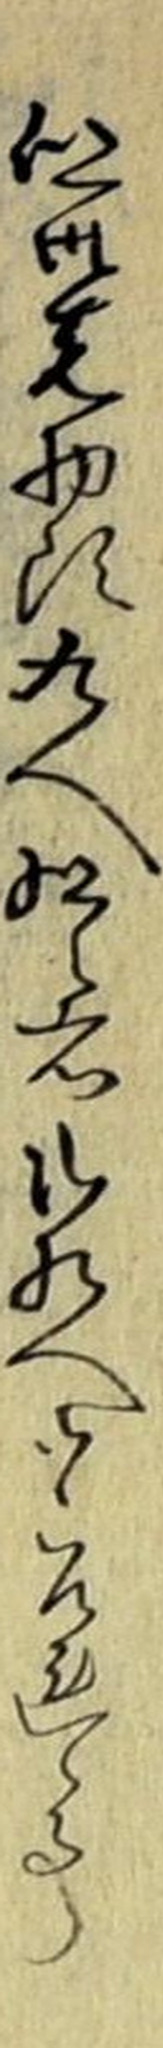但御先物頭九人組之者弐拾人つヽ召連候事
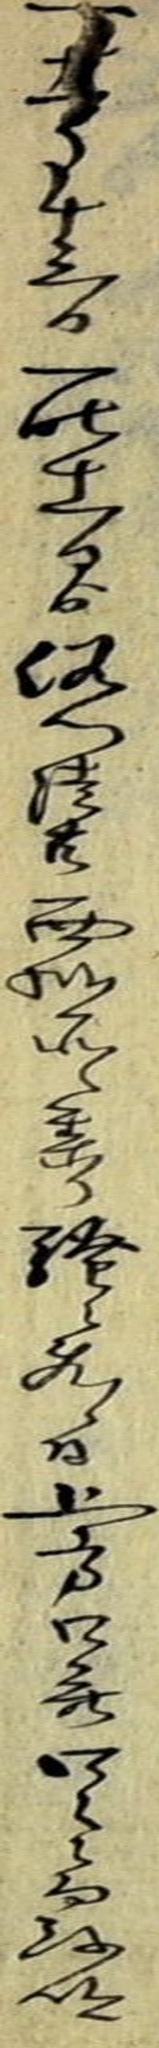一十一月十三日一昨十一日ゟ俗門徒共西掛所へ参り騒敷候付上方口并口々に而致吟
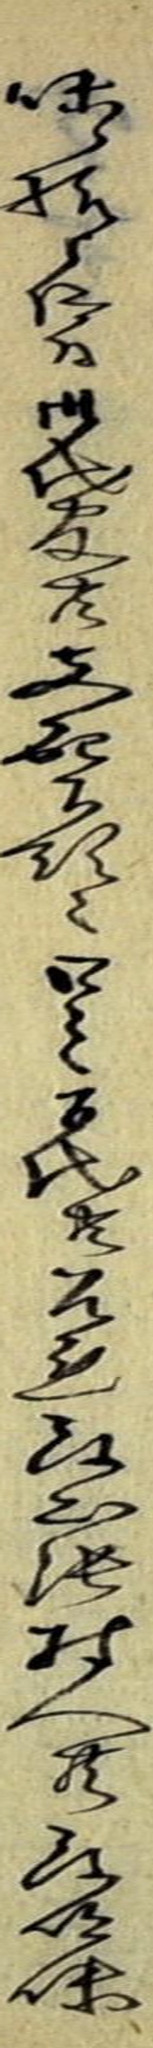味候様被仰付御代官共支配下領々口々へ下代共召連致出張村人共致吟味
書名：命令之部 四
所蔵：福井県文書館 Fukui Prefectural Archives
